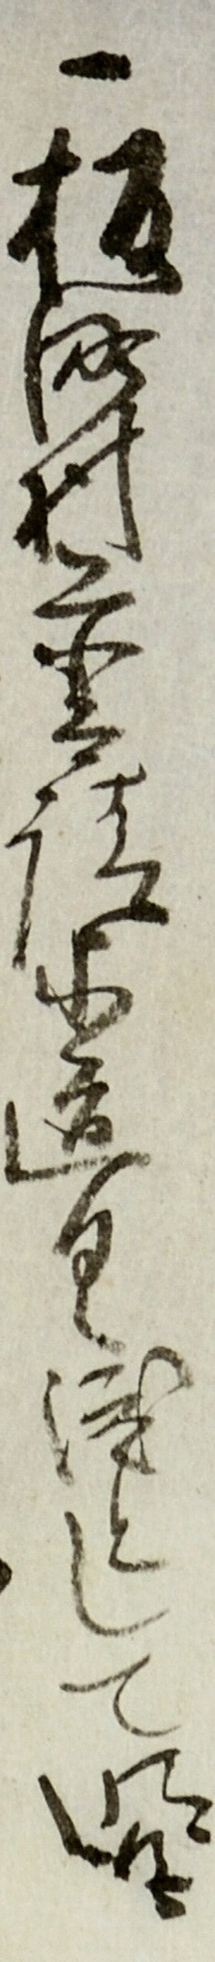一板町村普請木道具渡として明後
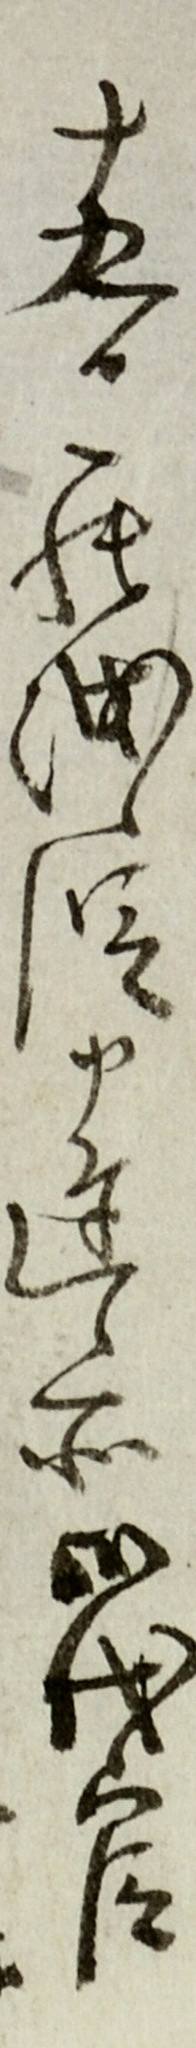十九日罷越候段申達候所御代官
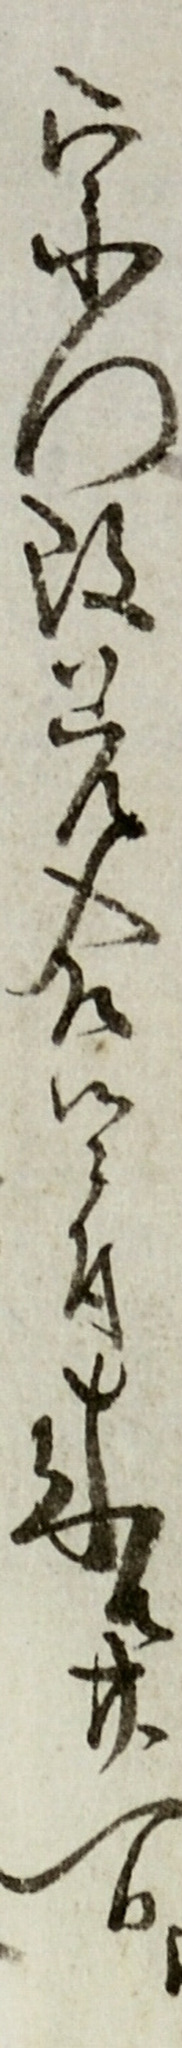宗門改差合候ニ付来ル廿一日江
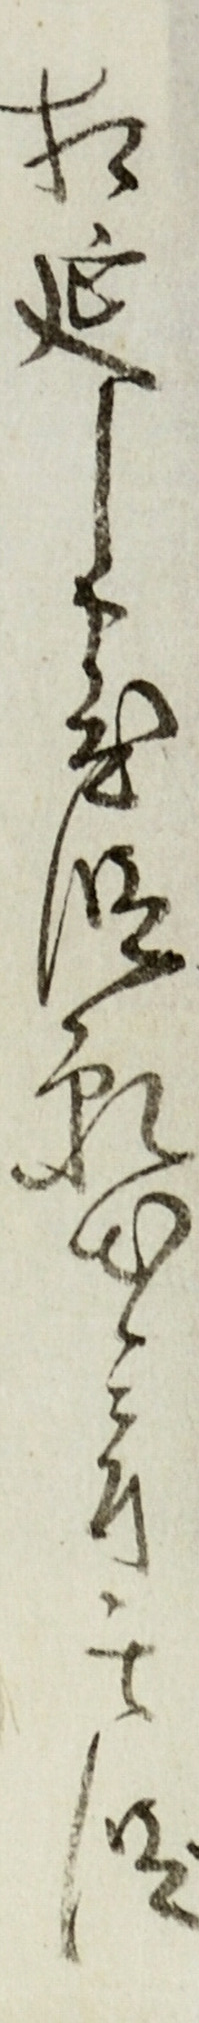相延し申度段願出候ニ付其段
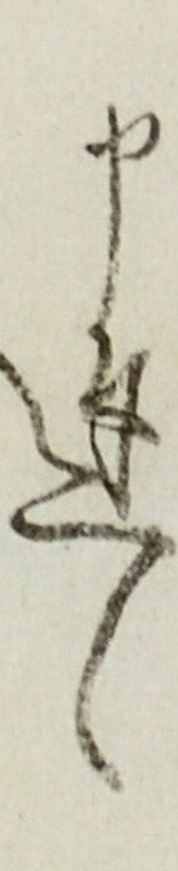申達候
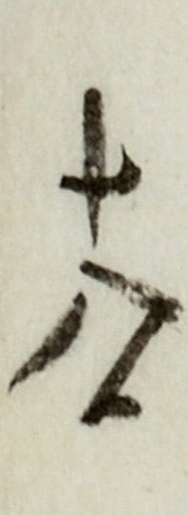十八日

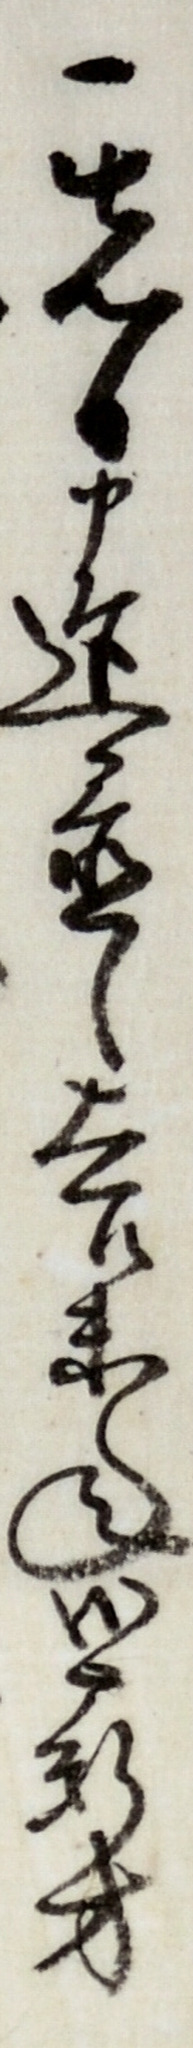一先日申達置候去ル未年御薪方
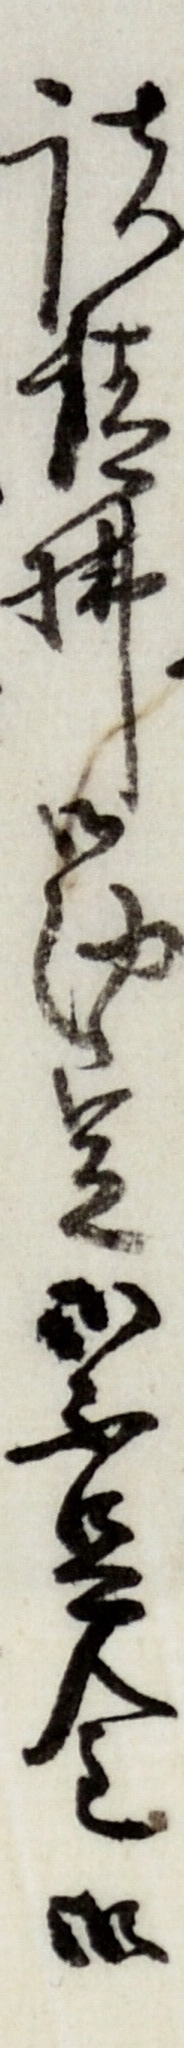諸請払御勘定御不足金御
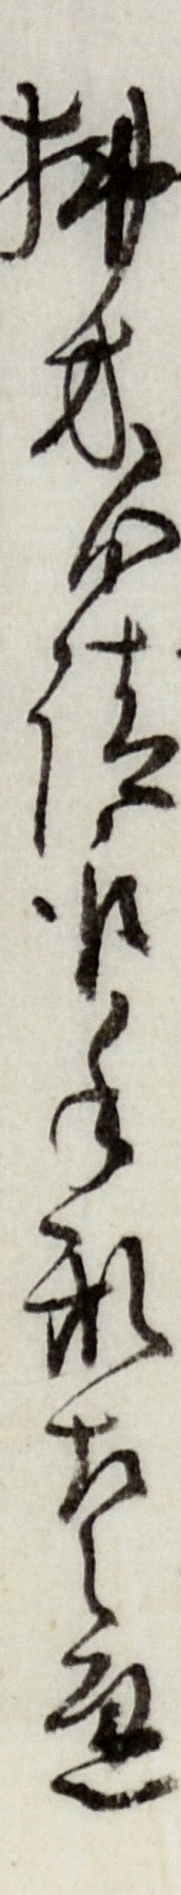払方ゟ請取手形左之通
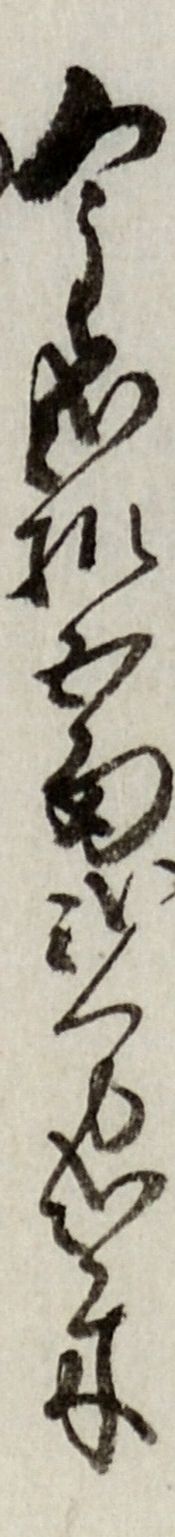金弐拾五両弐分弐朱
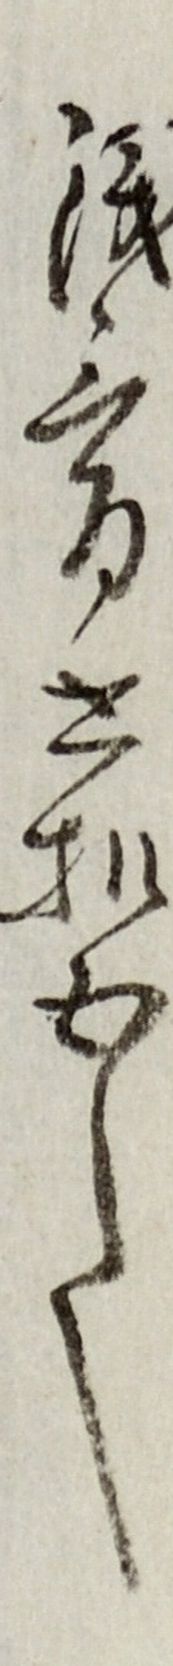銭三百六拾五文
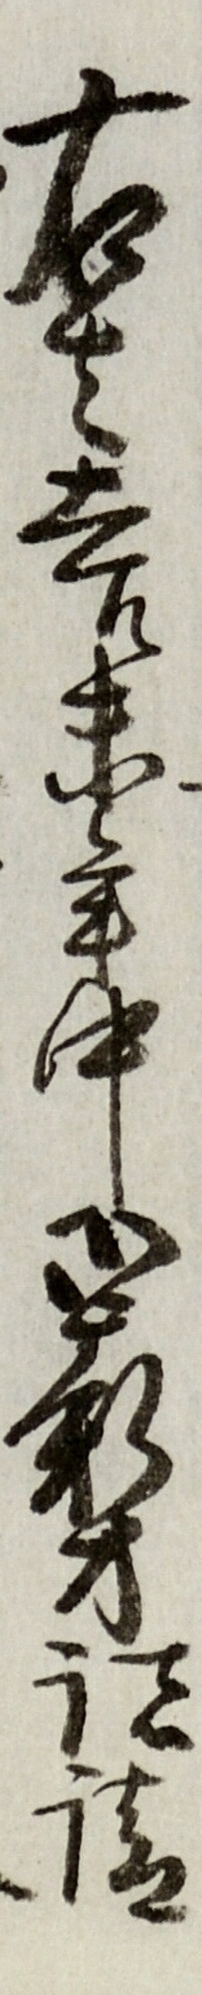右者去ル未年中御薪方諸請
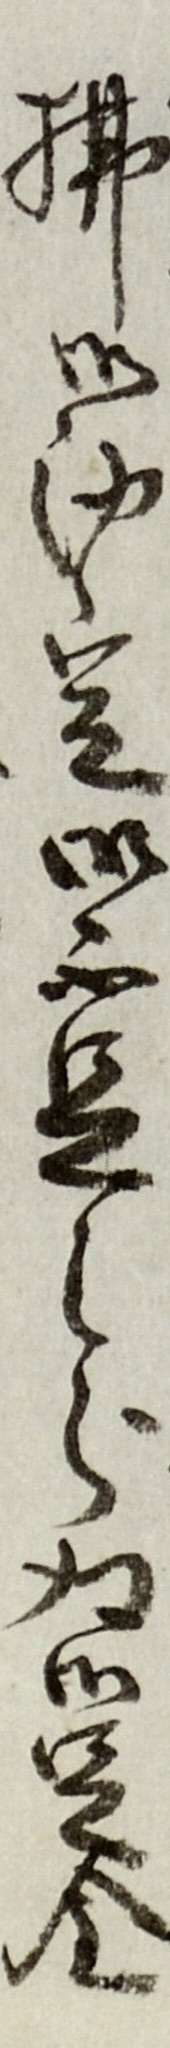払御勘定御不足之分為御足金
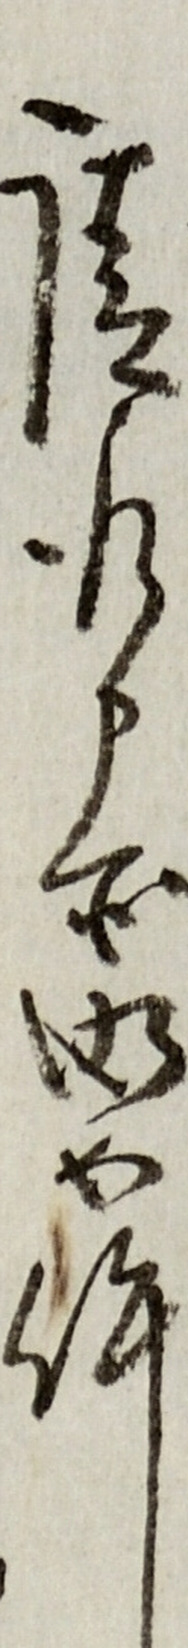請取申所仍如件
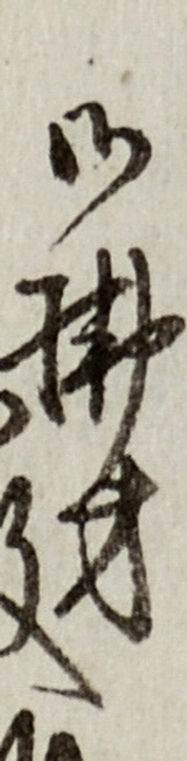御払方
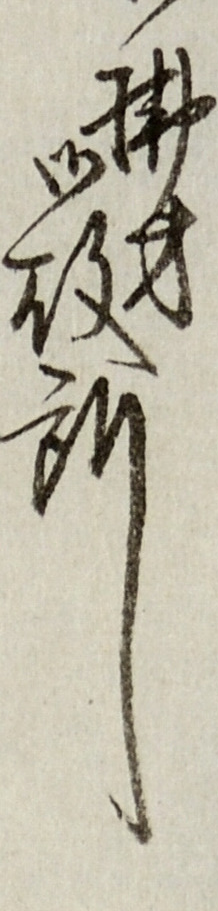御役所
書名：御山方御薪方諸事御用留
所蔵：伊那市立高遠町図書館・合同会社AMANE
